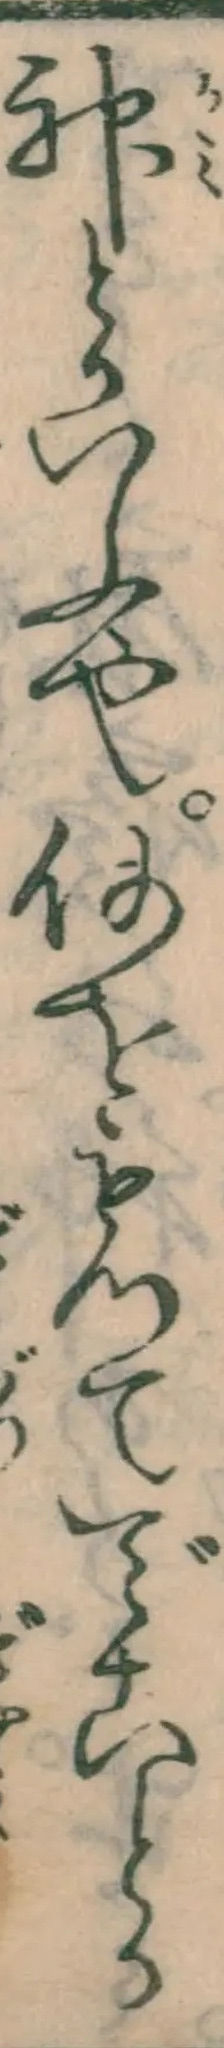神といふや。何をもつてでことか
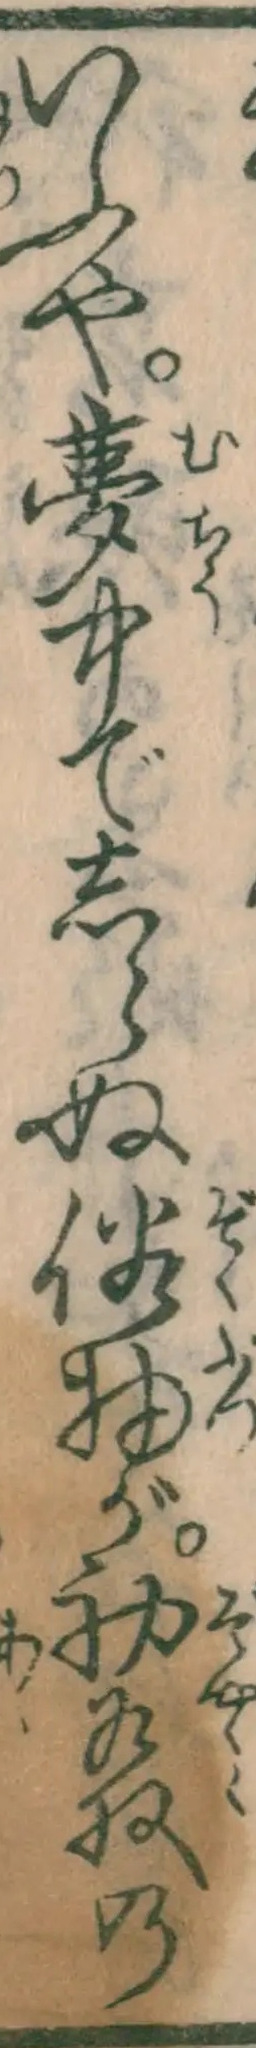いふや。夢中でしらぬ俗物が。初発の
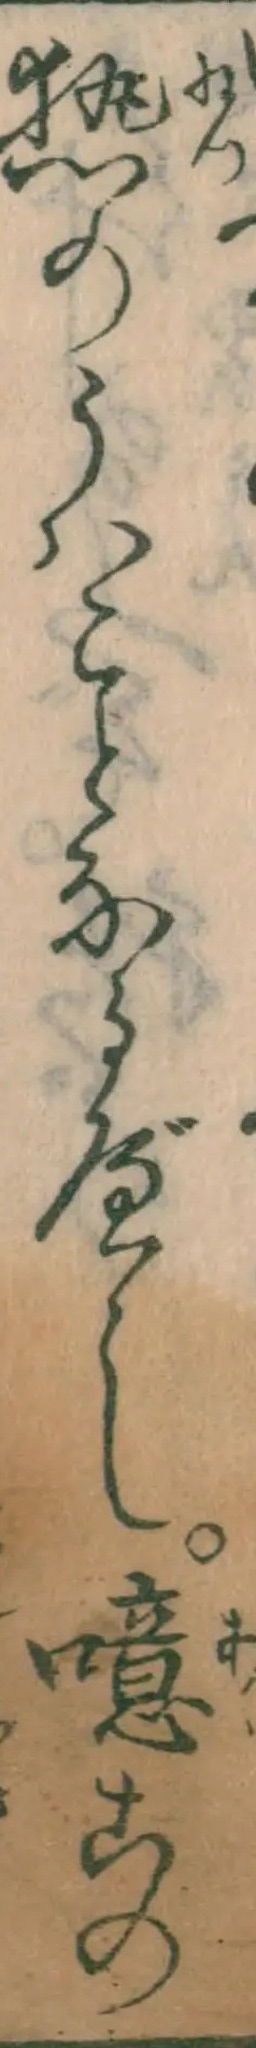熱のうはことなるべし。噫この
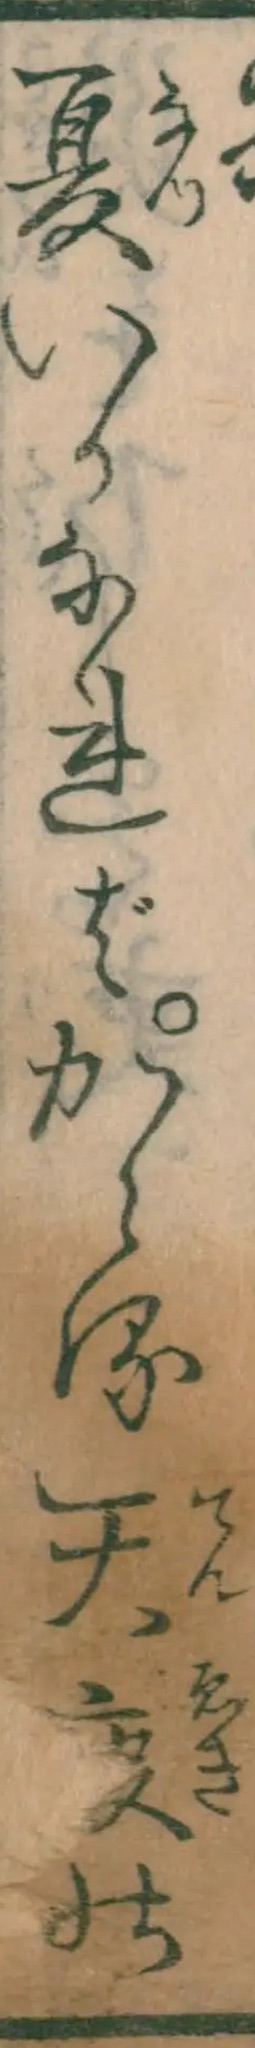夏いかなれば。かゝる天疫の

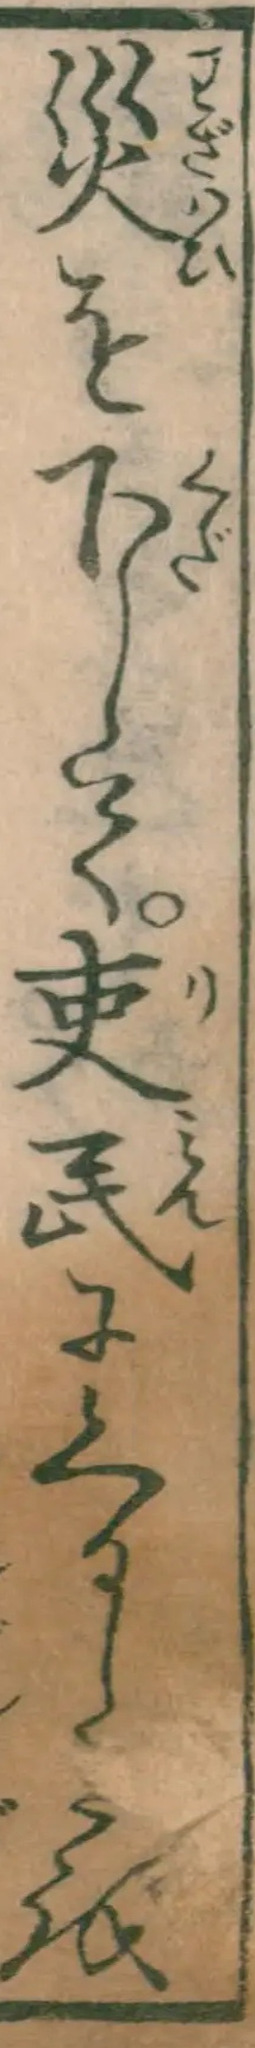災を下して。吏民にくるしみを
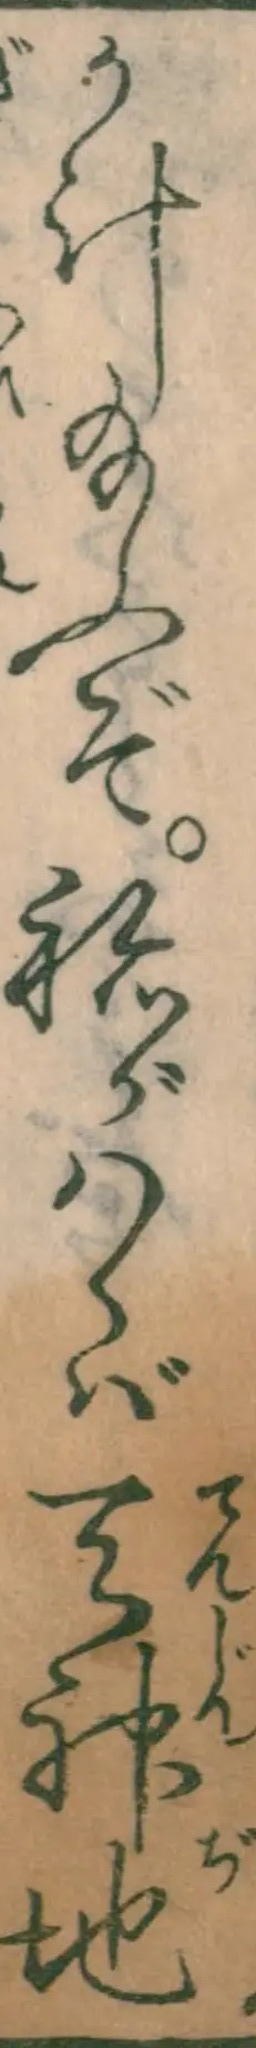かけ給ふぞ。ねがはくば天神地
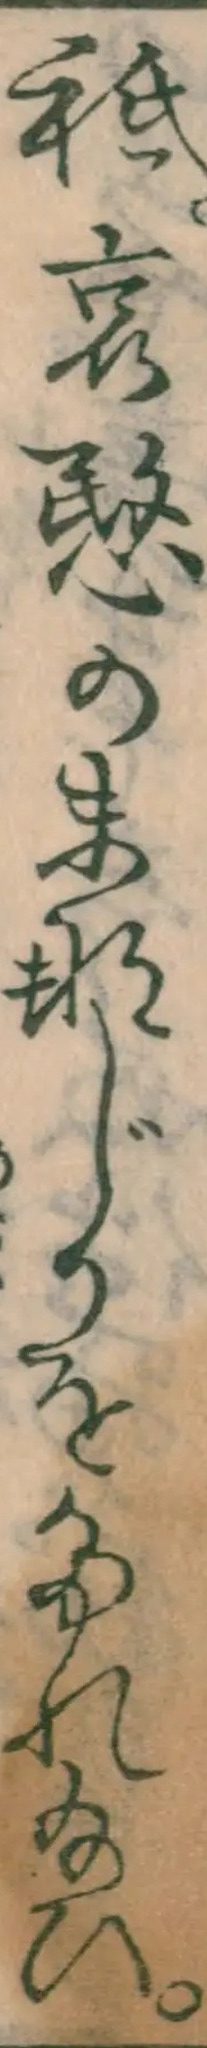祇。哀愍のまなじりをたれ給ひ。
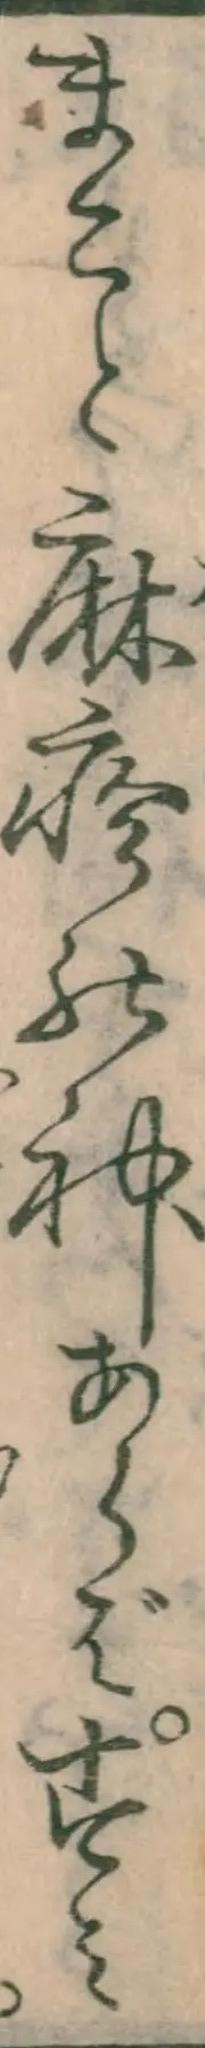まこと麻疹の神あらず。すみ
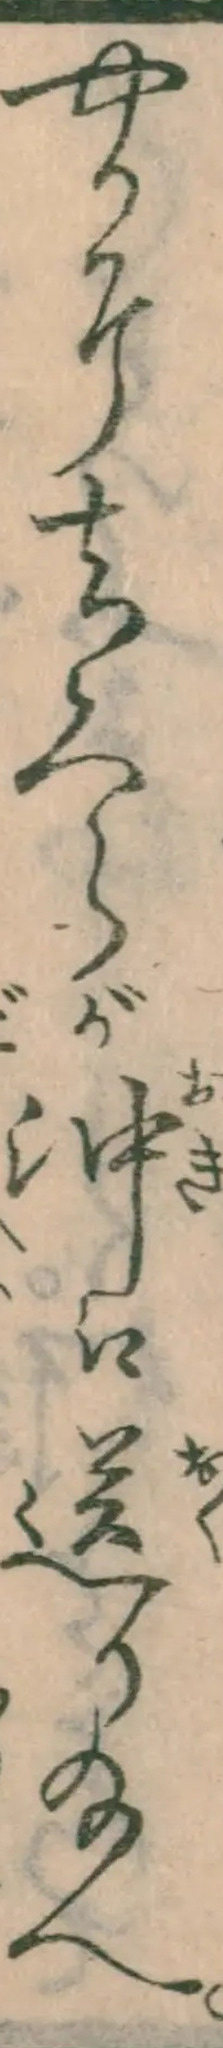やかにちくらが沖え送り給へ。
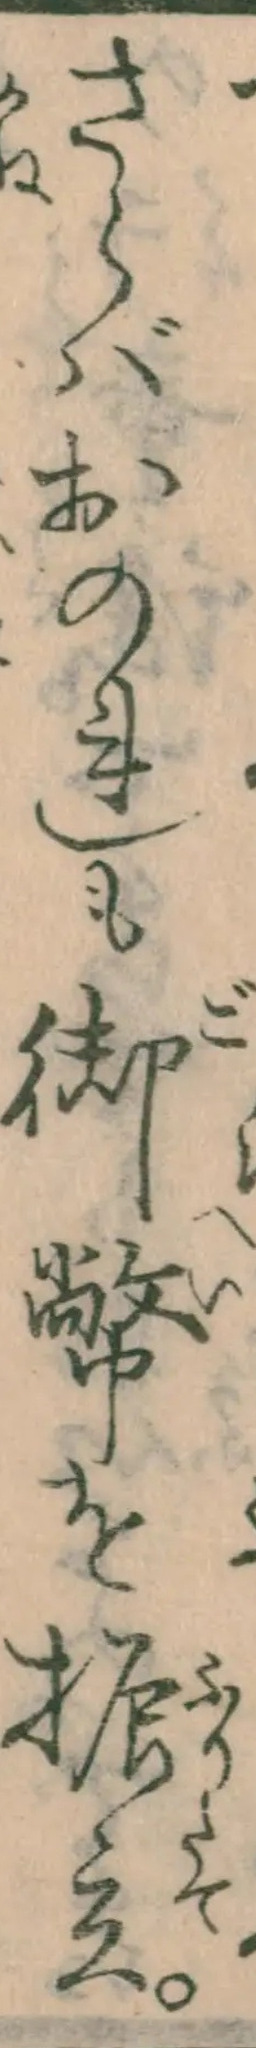さらばおのれも御幣を振立。
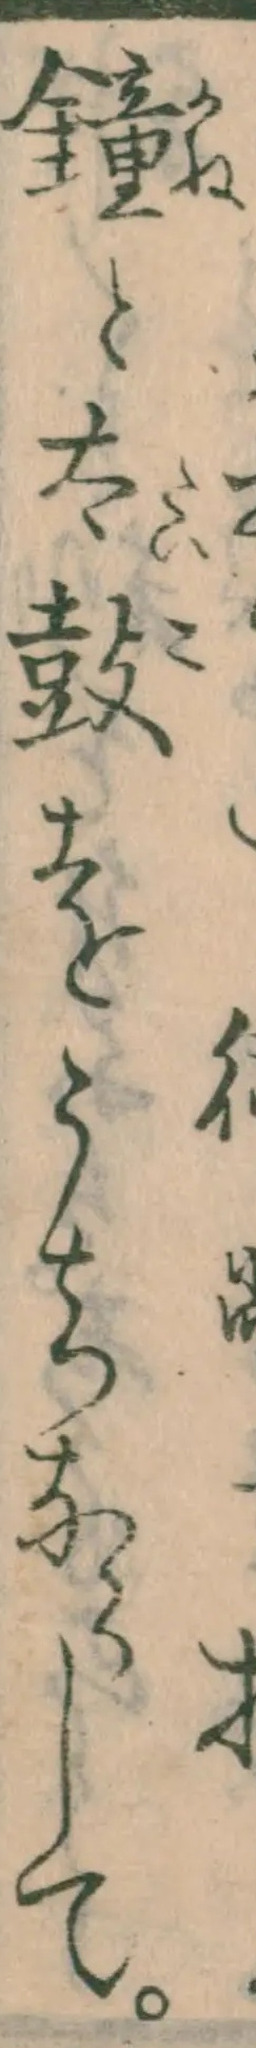鐘と太鼓をうちならして。
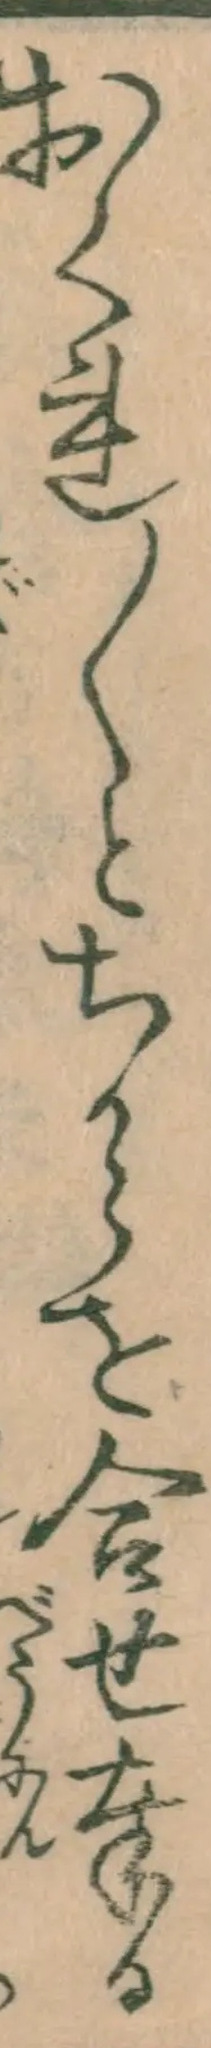おくれ〳〵とちからを合せ奉る
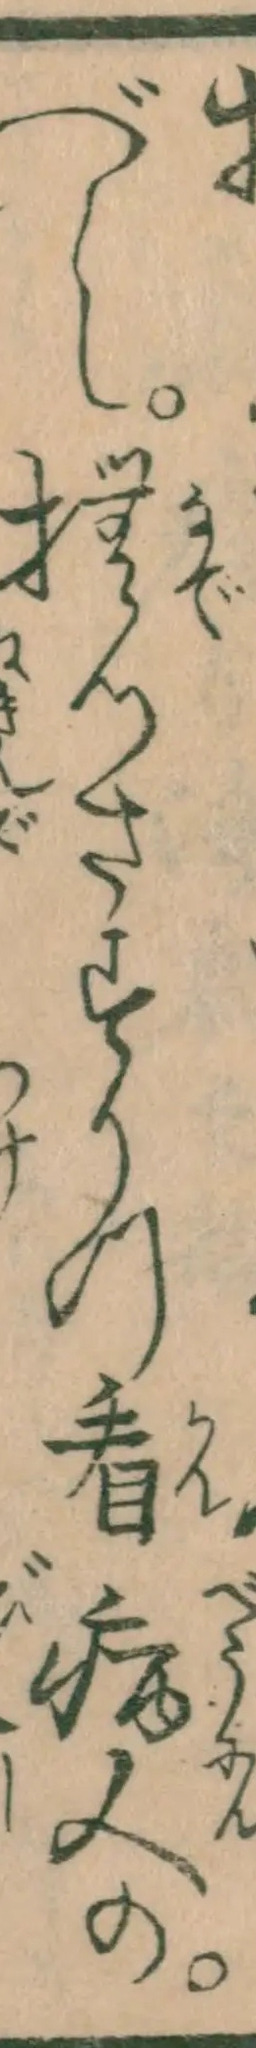べし。撫つさすりつ看病人の。
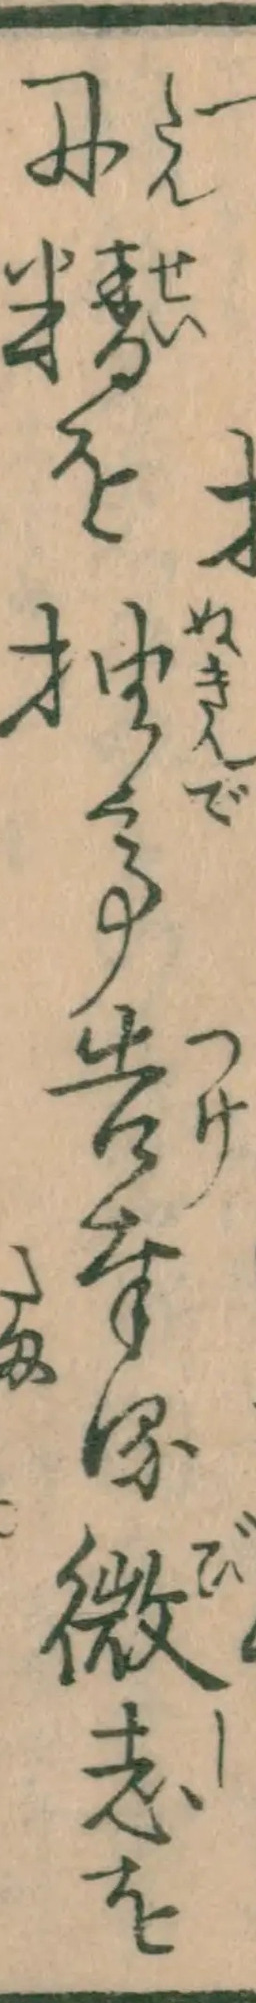丹精を抽て告奉る微志を
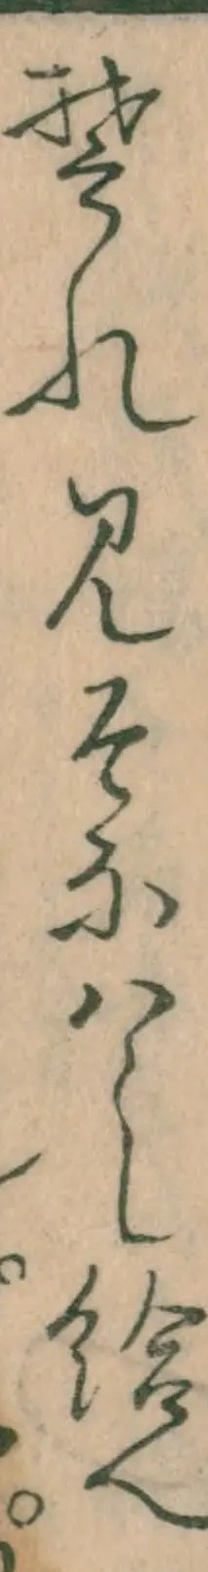それ見そなはし給へ。

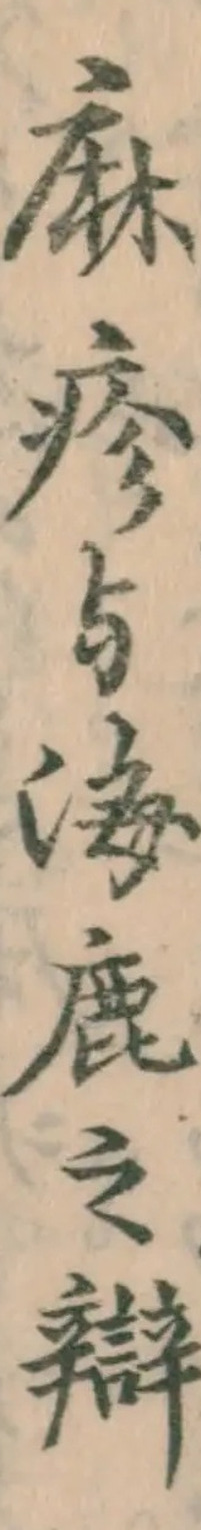麻疹と海鹿之弁
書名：麻疹戯言
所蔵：国立国会図書館 National Diet Library, JAPAN
